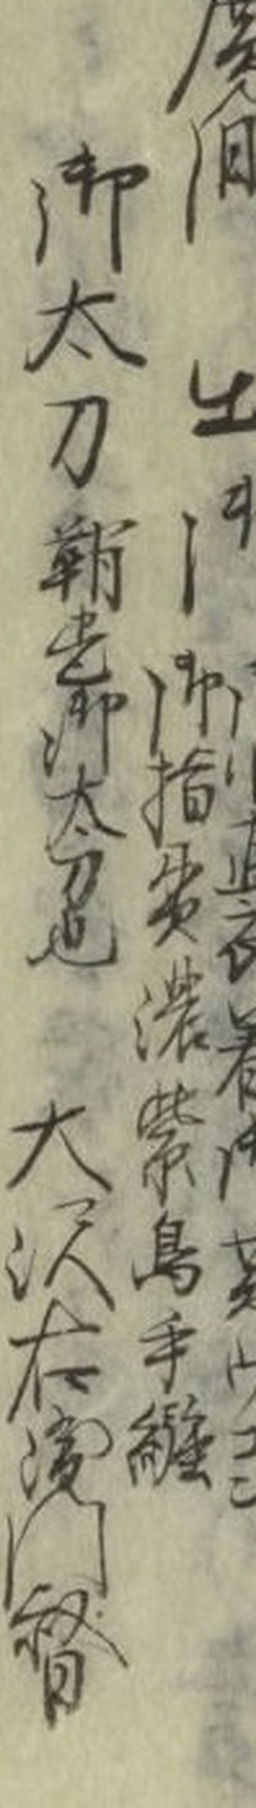御太刀鞘巻御太刀也大沢右衛門督
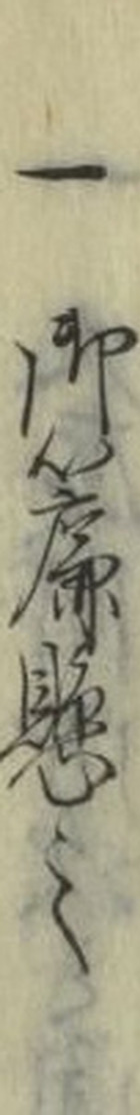一御簾懸之
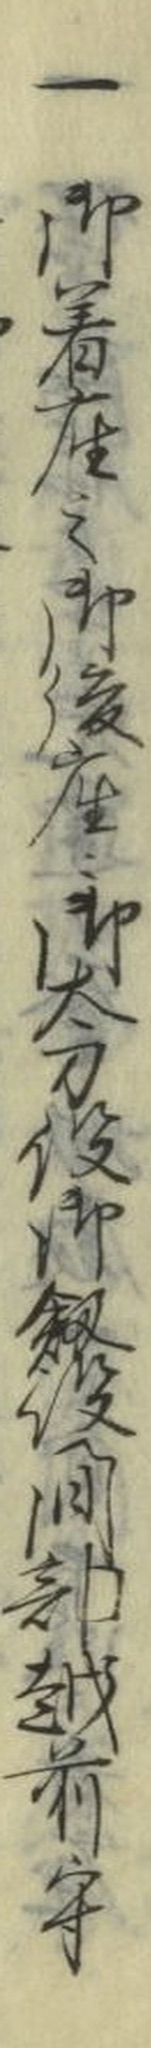一御着座之御後座に御太刀役御剣役間部越前守
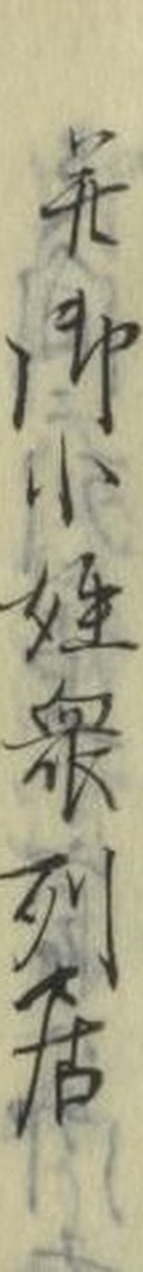幷御小姓衆列居
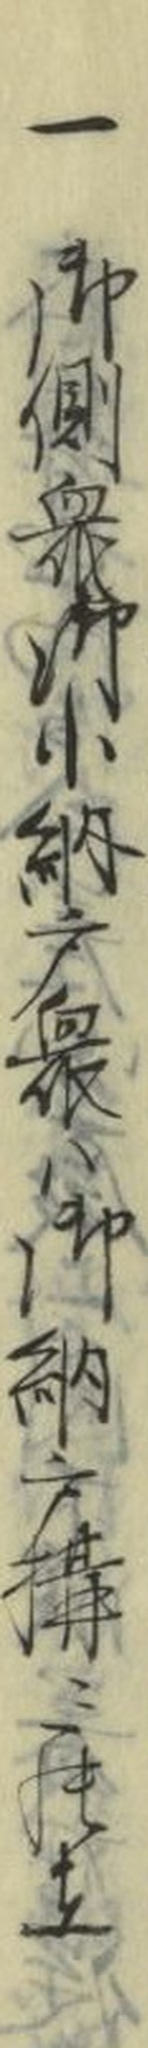一御側衆御小納戸衆は御納戸構に罷在
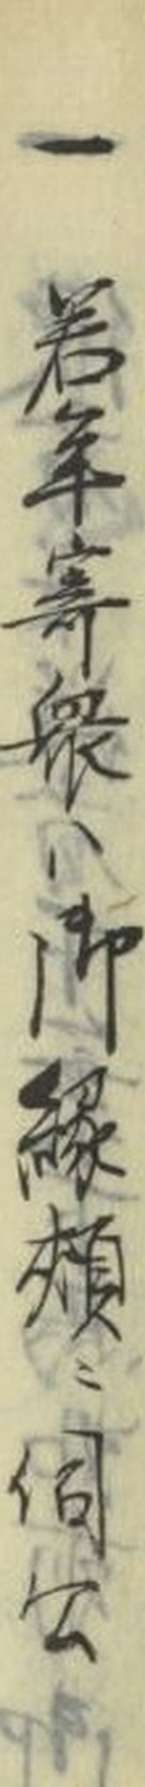一若年寄衆は御縁頬に伺公
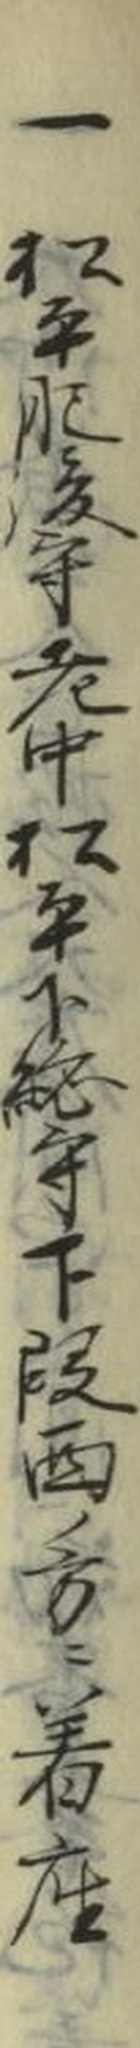一松平肥後守老中松平下総守下段四の方に着座
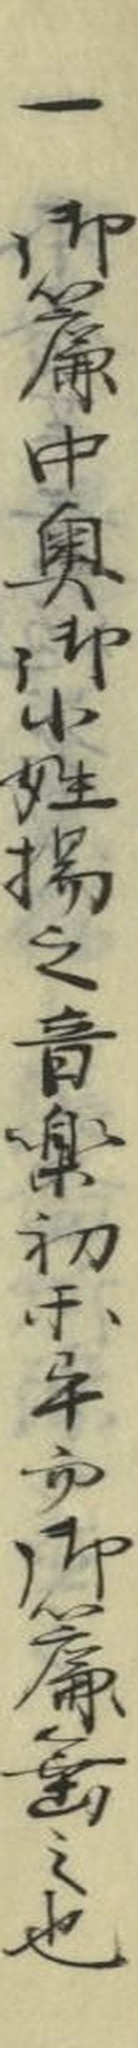一御簾中奥御小姓揚之音楽初楽畢而御簾垂之也
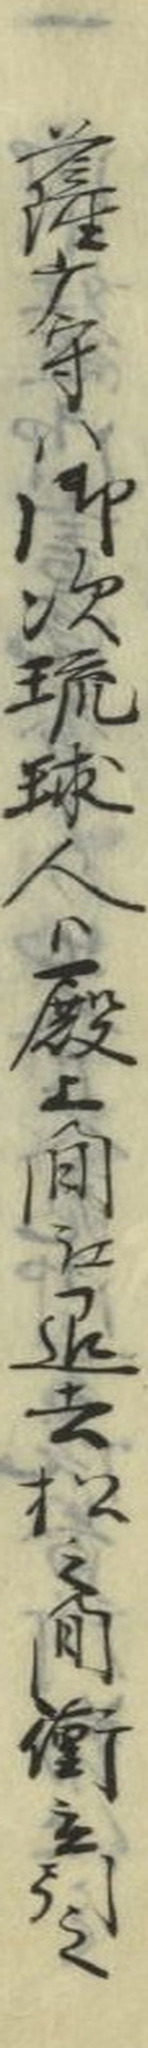薩摩守は御次琉球人は殿上間え退去松之間衝立引之
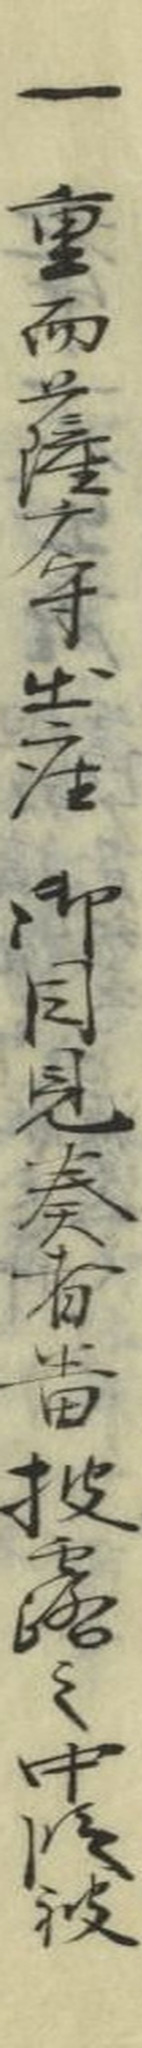一重而薩摩守出座御目見奏者番披露之中段被
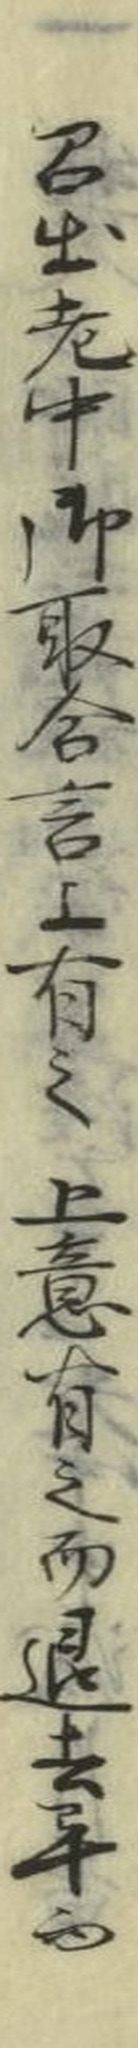召出老中取合言上有之上意有之而退去畢而
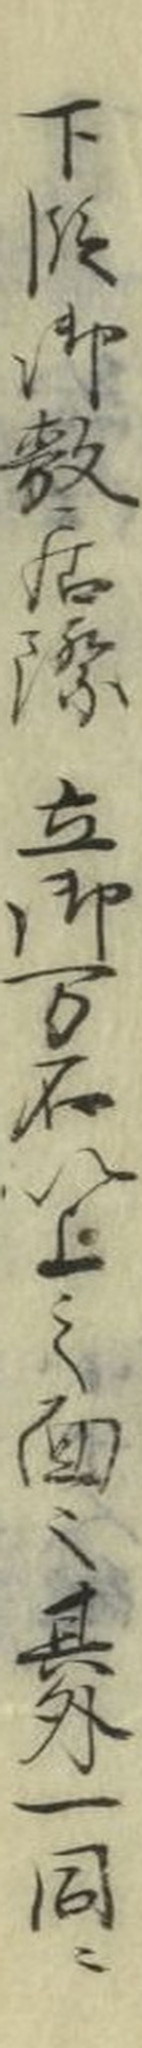下段御敷居際立御万石以上之面々其外一同に
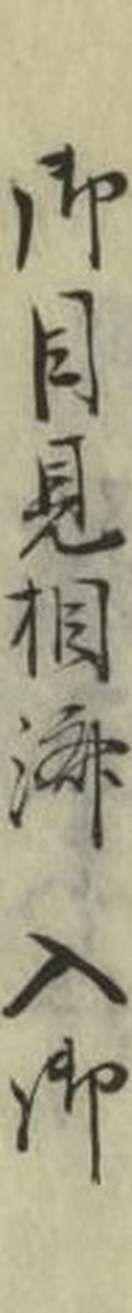御目見相済入御
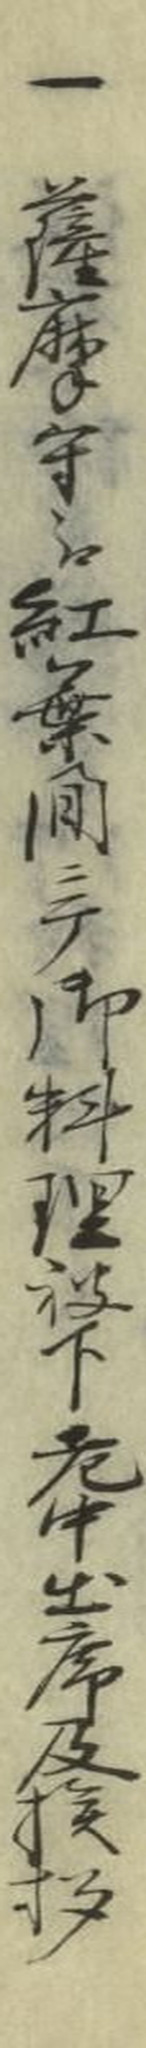一薩摩守え紅葉間にて御料理被下老中出席及挨拶
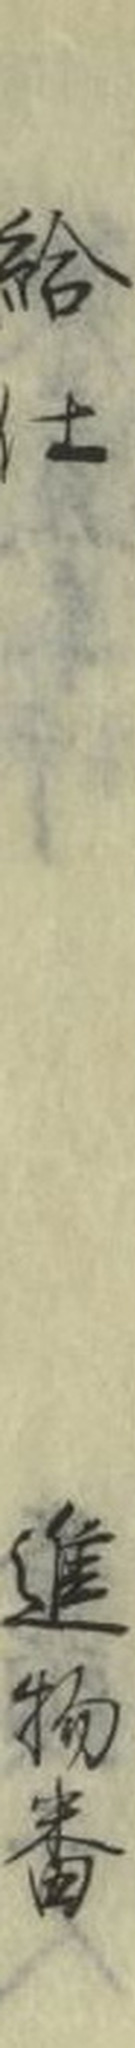給仕進物番
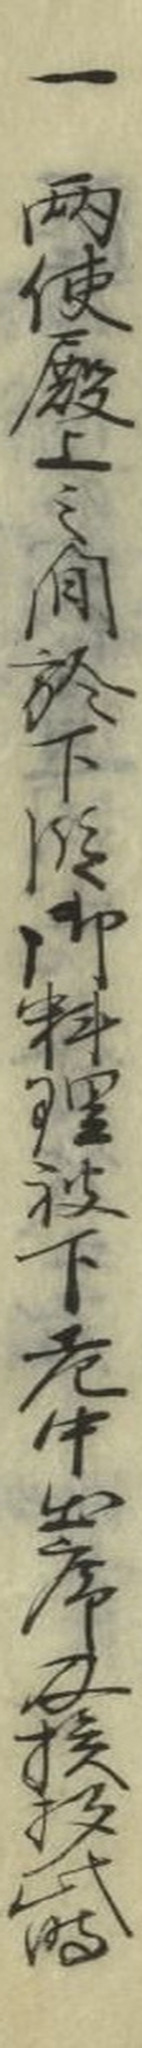一両使殿上之間於下段御料理被下老中出席及挨拶此時
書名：宝永七庚寅年琉球国来聘使日記
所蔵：University of the Ryukyus Library
